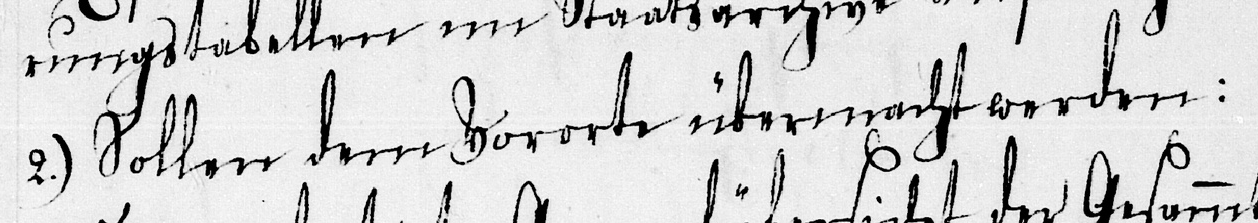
2.) Sollen dem Vororte übermacht werden:
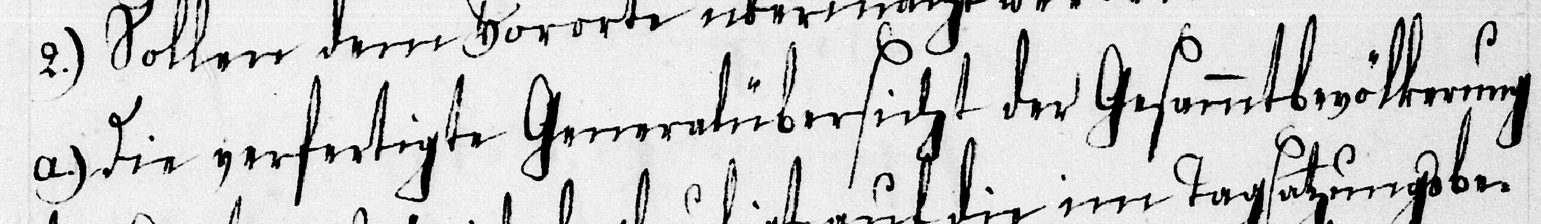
a.) Die verfertigte Generalübersicht der Gesammtbevölkerung
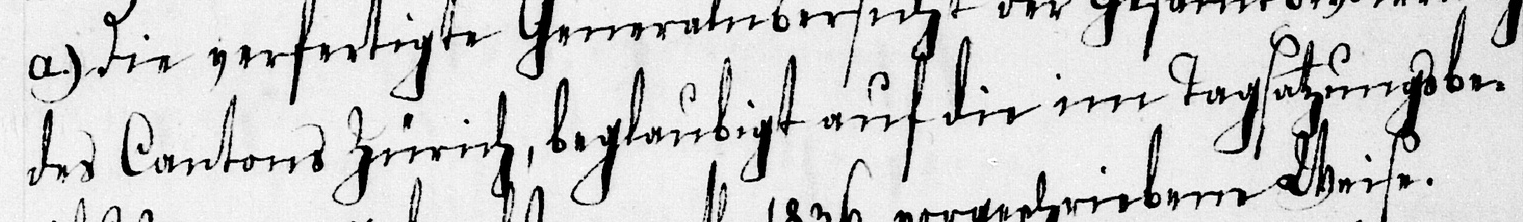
des Cantons Zürich, beglaubigt auf die im Tagsatzungsbe¬
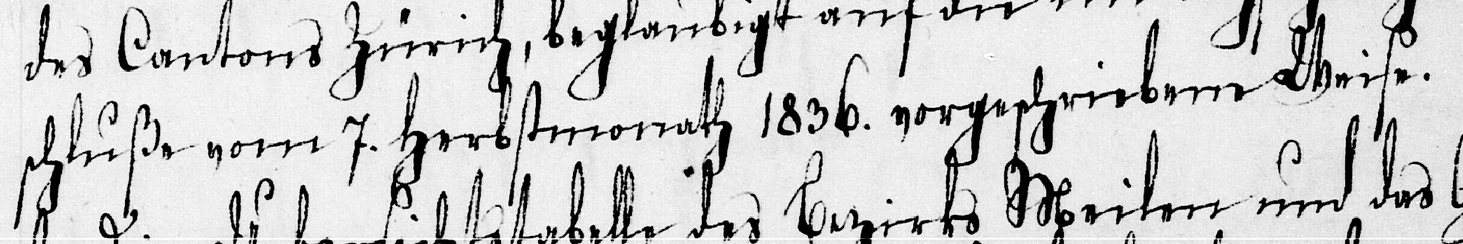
schluße vom 7. Herbstmonath 1836. vorgeschriebene Weise.
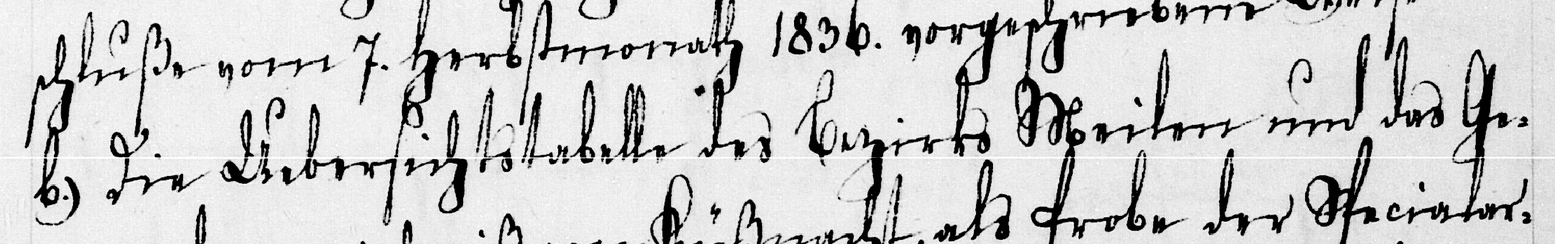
b.) Die Uebersichtstabelle des Bezirks Meilen und das Ge¬
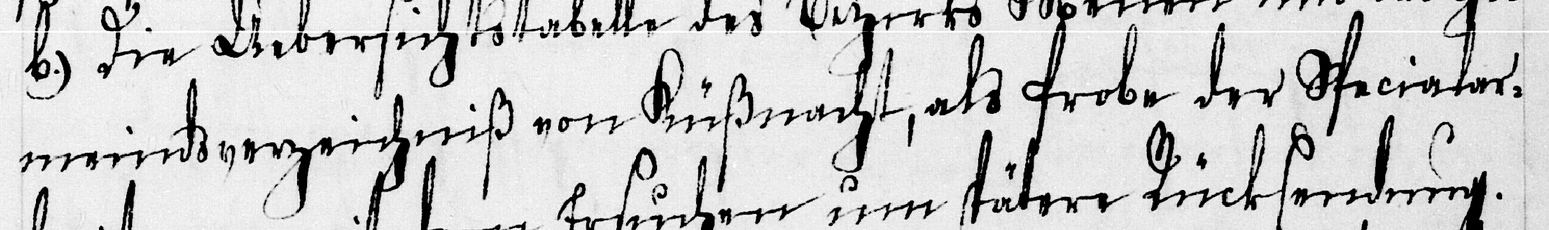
meindsverzeichniß von Küßnacht, als Probe der Specialar¬
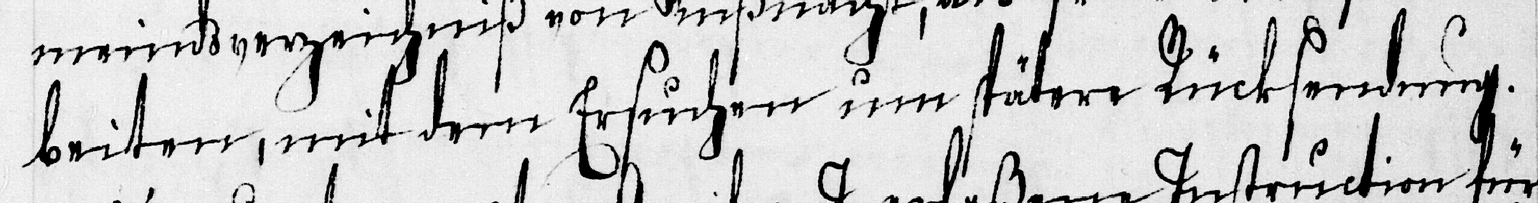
beiten, mit dem Ersuchen um spätere Rücksendung.
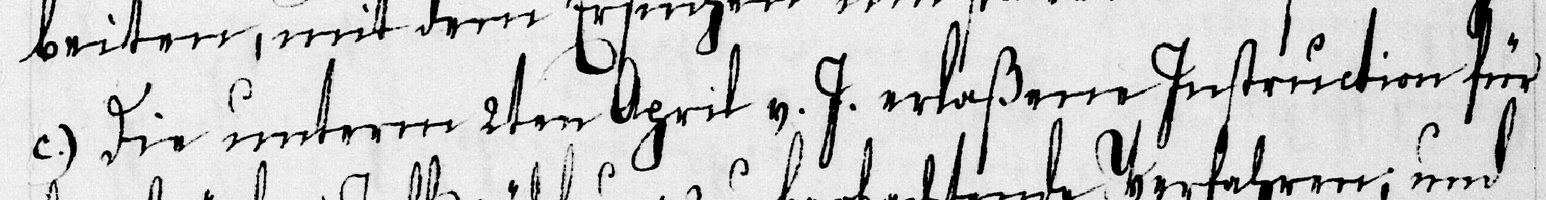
c.) Die unterm 2ten April v. J. erlaßene Instruction für
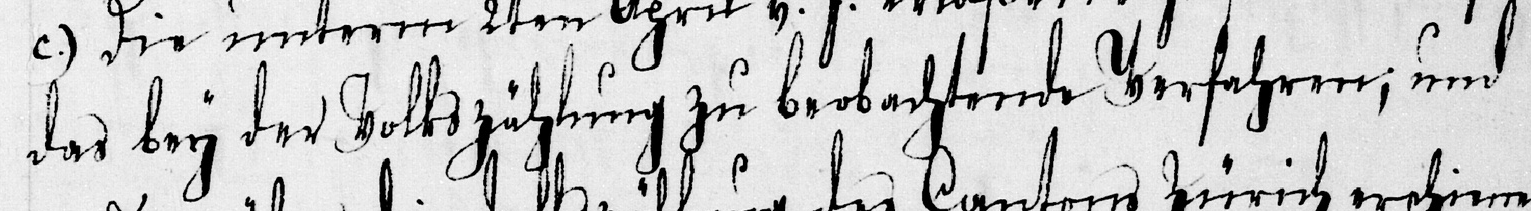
das bey der Volkszählung zu beobachtende Verfahren; und
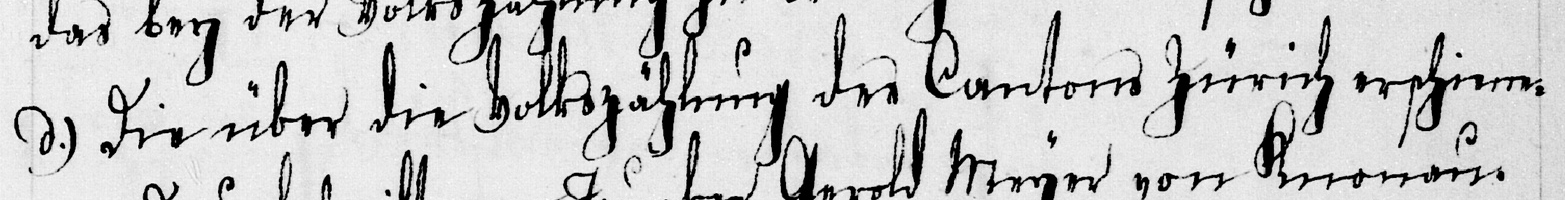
d.) Die über die Volkszählung des Cantons Zürich erschiene¬
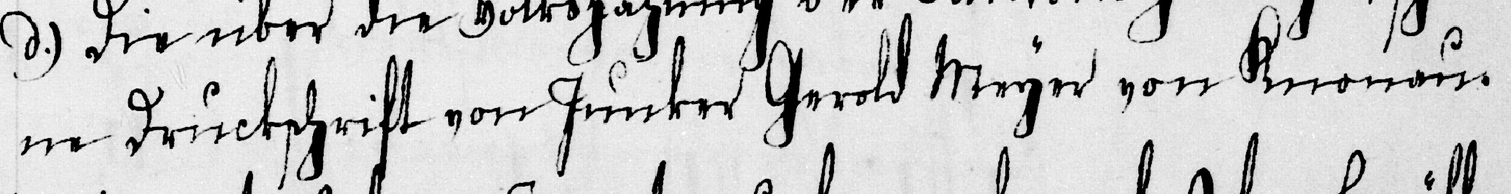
ne Druckschrift von Junker Gerold Meyer von Knonau.
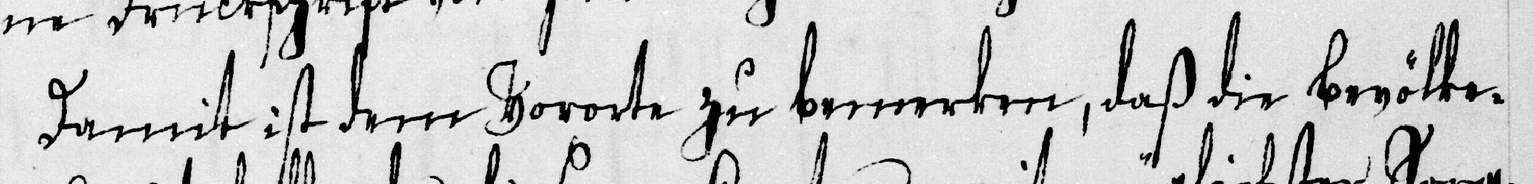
Damit ist dem Vororte zu bemerken, daß die Bevölke¬
